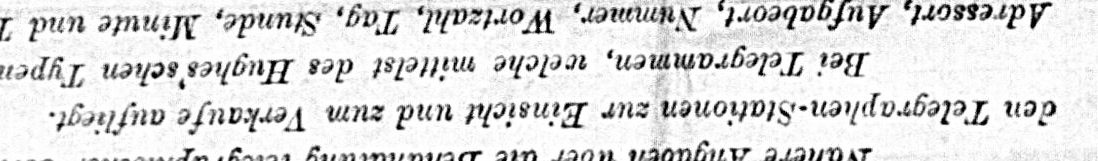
den Telegraphen-Stationen zur Einsicht und zum Verkaufe aufliegt.
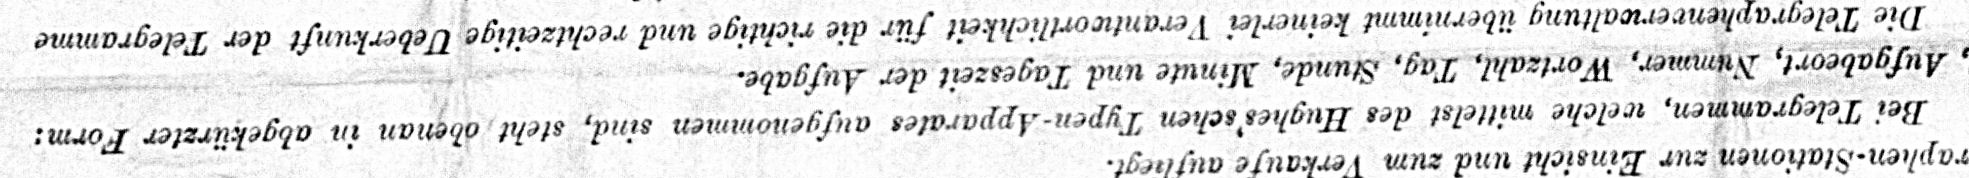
Bei Telegrammen, welche mittelst des Hughes'schen Typen-Apparates aufgenommen sind, steht obenan in abgekürzter Form:
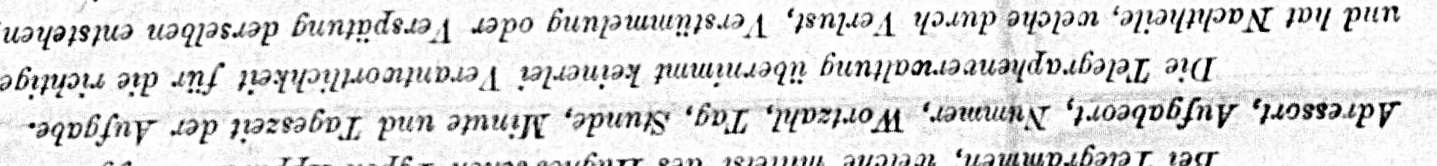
Adressort, Aufgabeort, Nummer, Wortzahl, Tag, Stunde, Minute und Tageszeit der Aufgabe.
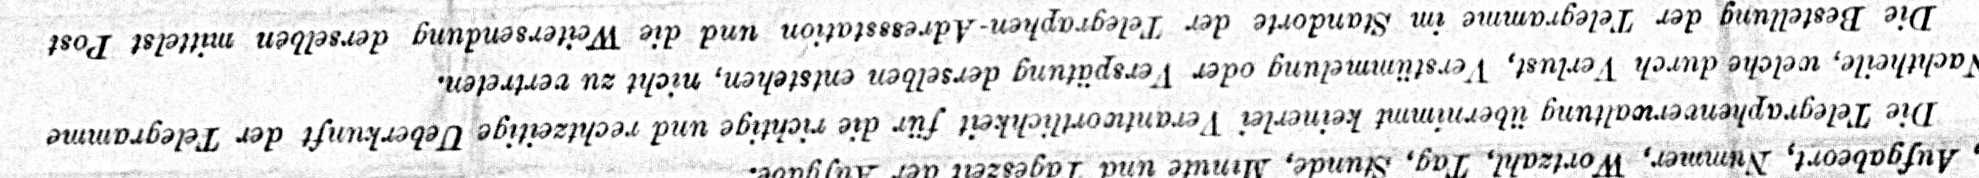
Die Telegraphenverwaltung übernimmt keinerlei Verantwortlichkeit für die richtige und rechtzeitige Ueberkunft der Telegramme
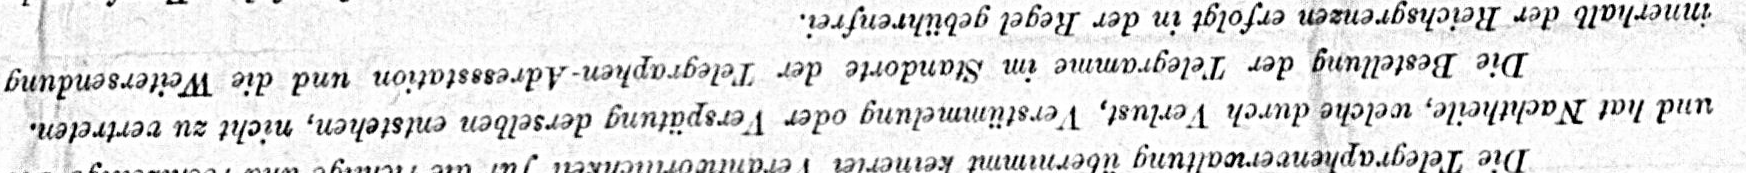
und hat Nachtheile, welche durch Verlust, Verstümmelung oder Verspätung derselben entstehen, nicht zu vertreten.
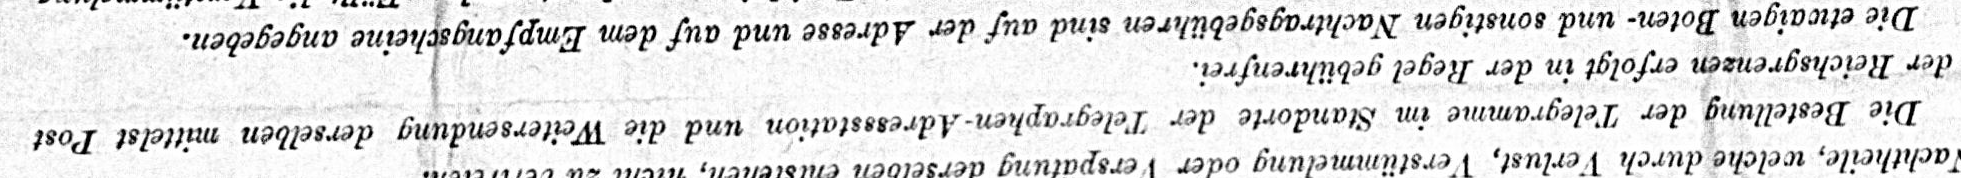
Die Bestellung der Telegramme im Standorte der Telegraphen-Adressstation und die Weitersendung derselben mittelst Post
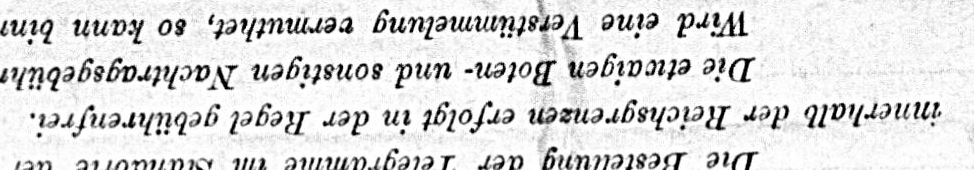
innerhalb der Reichsgrenzen erfolgt in der Regel gebührenfrei.
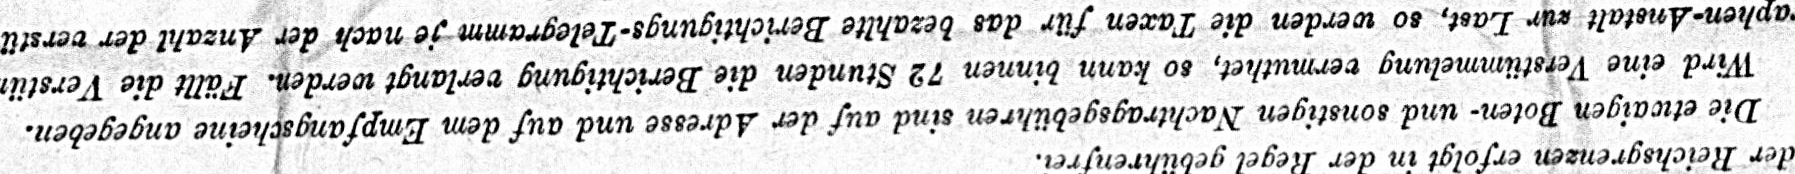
Die etwaigen Boten- und sonstigen Nachtragsgebühren sind auf der Adresse und auf dem Empfangscheine angegeben.
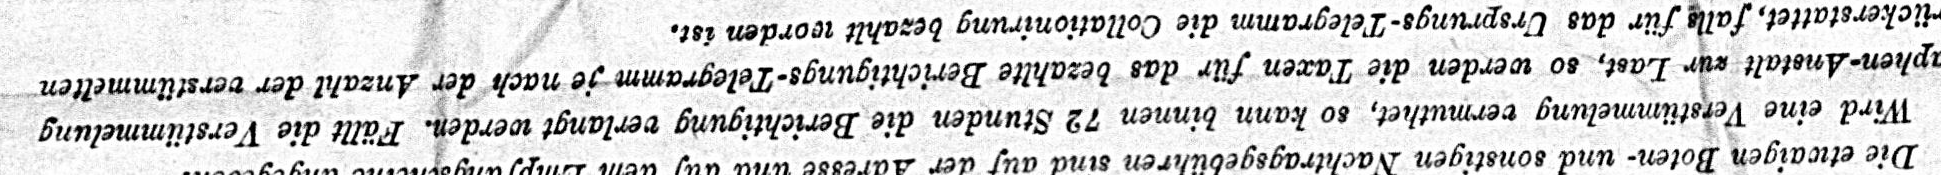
Wird eine Verstümmelung vermuthet, so kann binnen 72 Stunden die Berichtigung verlangt werden. Fällt die Verstümmelung
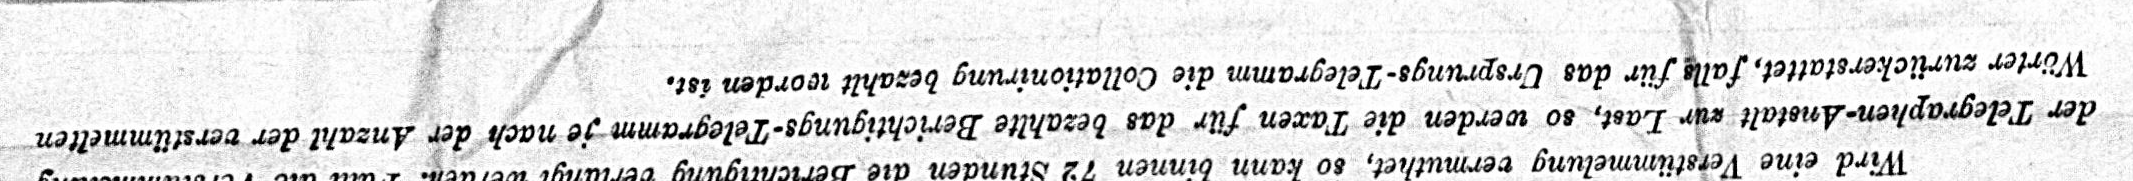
der Telegraphen-Anstalt zur Last, so werden die Taxen für das bezahlte Berichtigungs-Telegramm je nach der Anzahl der verstümmelten
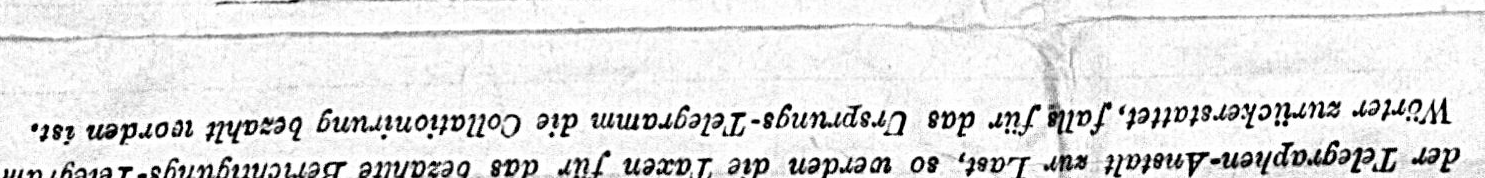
Wörter zurückerstattet, falls für das Ursprungs-Telegramm die Collationirung bezahlt worden ist.
